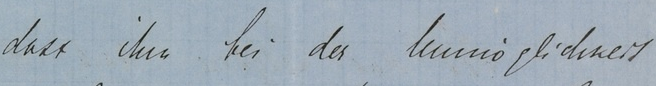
dass ihm bei der Unmöglichkeit
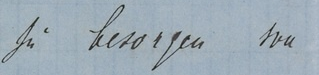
zu besorgen von
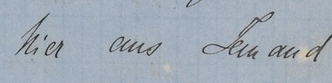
hier aus jemand
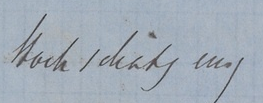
Hochschätzung
